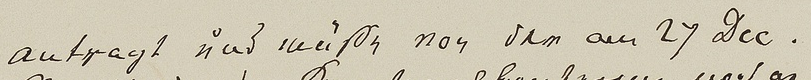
antragt und müße von der am 27 Dec .
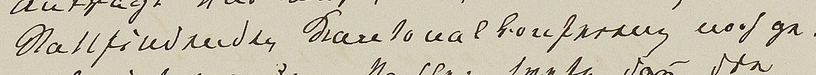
Stattfindenden Kantonalkonferenz noch ge-
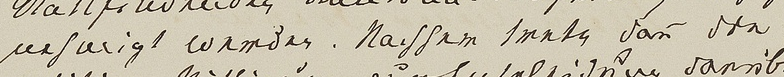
nehmigt werden. Nachher trete dann die
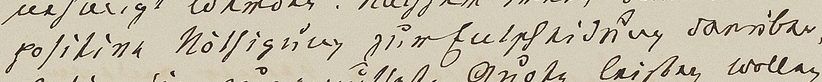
positive Nöthigung zur Entscheidung darüber,
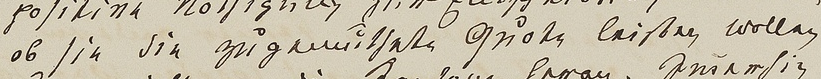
ob sie die zugemuthete Quote leisten wollen
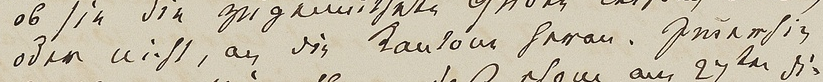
oder nicht, an die Kantone heran. Immerhin
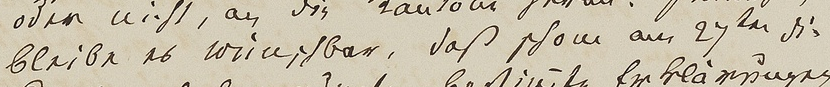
bleibe es wünschbar, daß schon am 27ten die
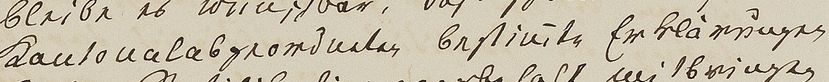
Kantonalabgeordneten bestimmte Erklärungen
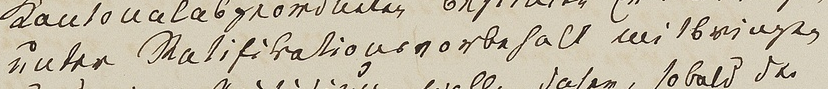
unter Ratifikationsvorbehalt mitbringen
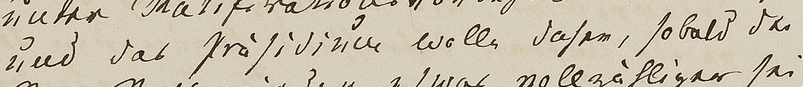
und das Präsidium wolle daher, sobald der
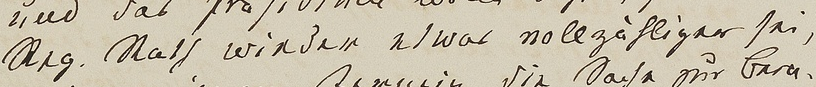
Reg.Rath wieder etwas vollzähliger sei,
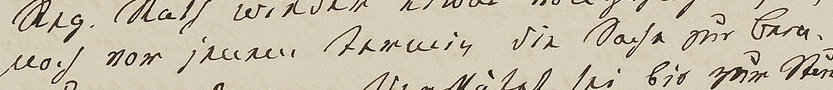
noch vor jenem Termin die Sache zur Bera-
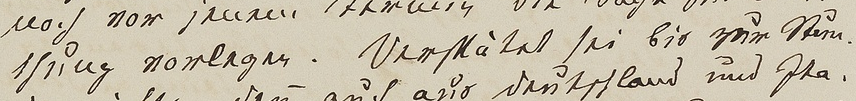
thung vorlegen. Verspätet sei bis zur Stun-
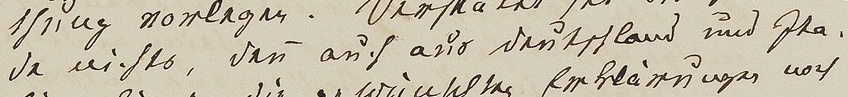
de nichts, denn auch aus Deutschland und Ita-
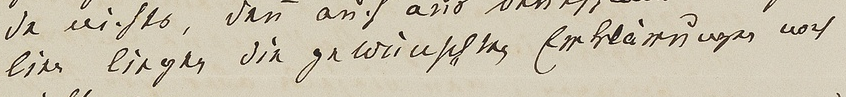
lien liegen die gewünschten Erklärungen noch
